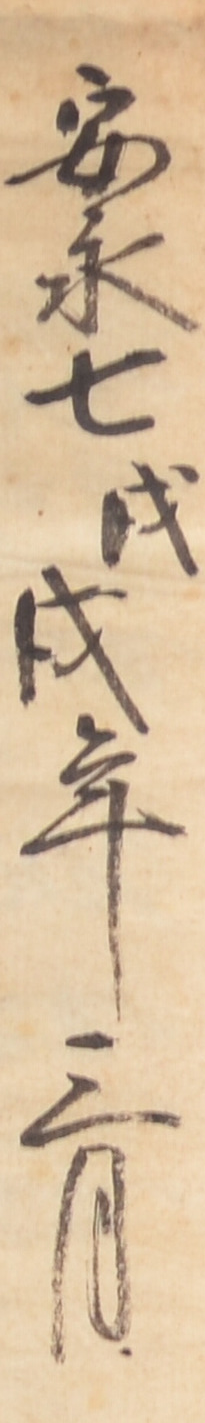安永七戊戌年三月
